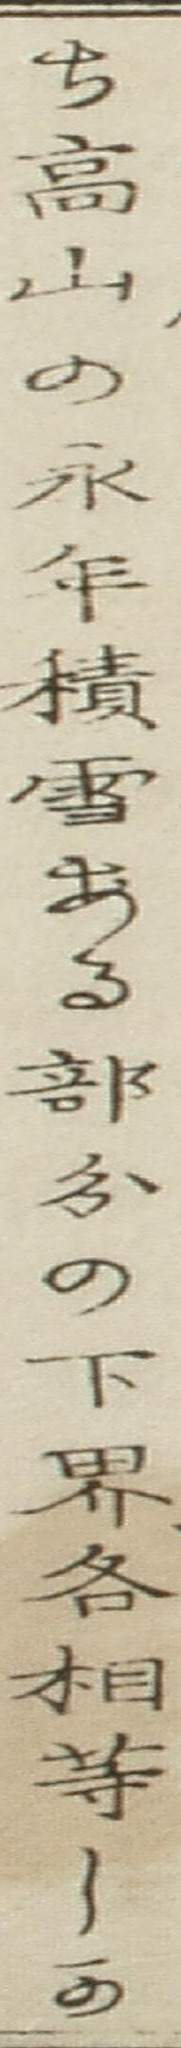ち高山の永年積雪ある部分の下界、各相等しか
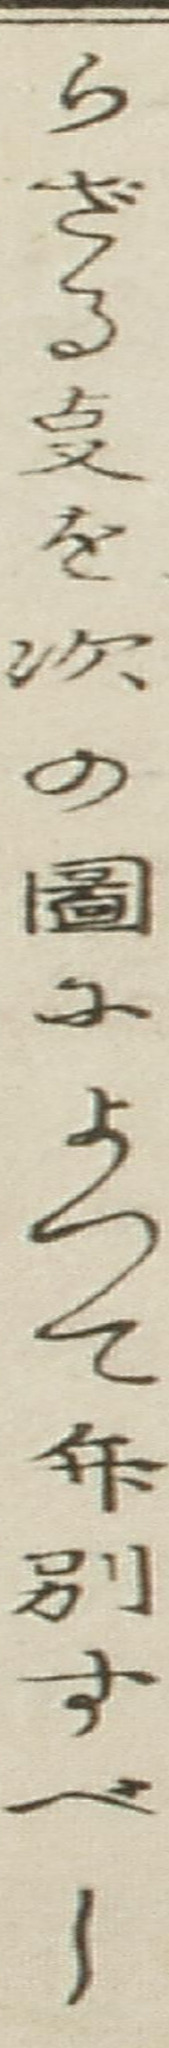らざる事を、次の図によつて弁別すべし

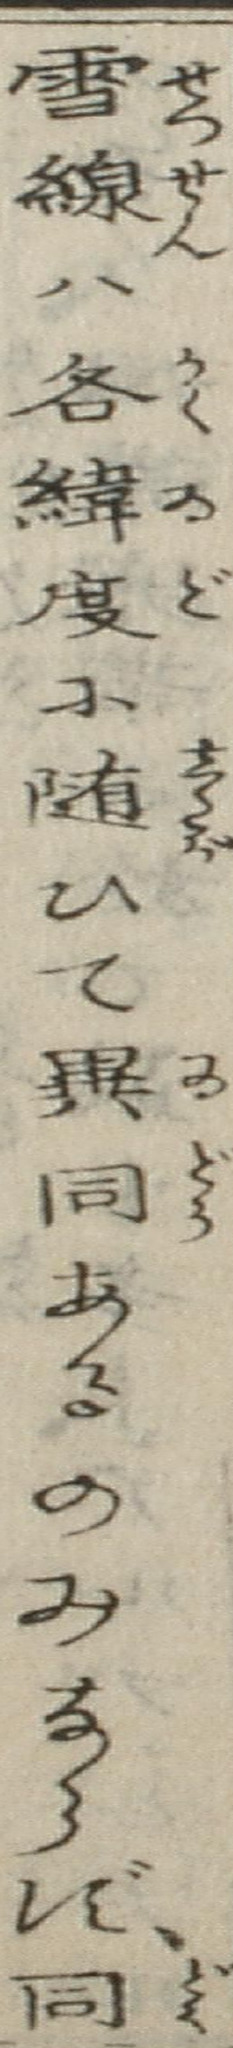雪線は各緯度に随ひて異同あるのみならず、同
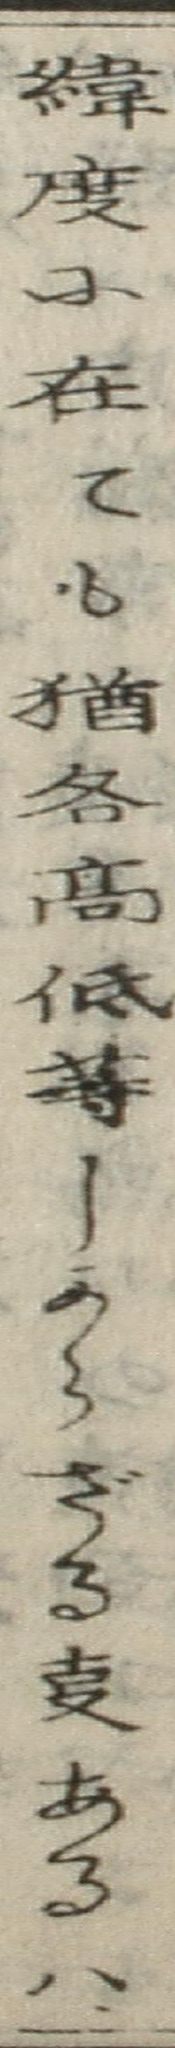緯度に在ても猶各高低等しからざる事あるは
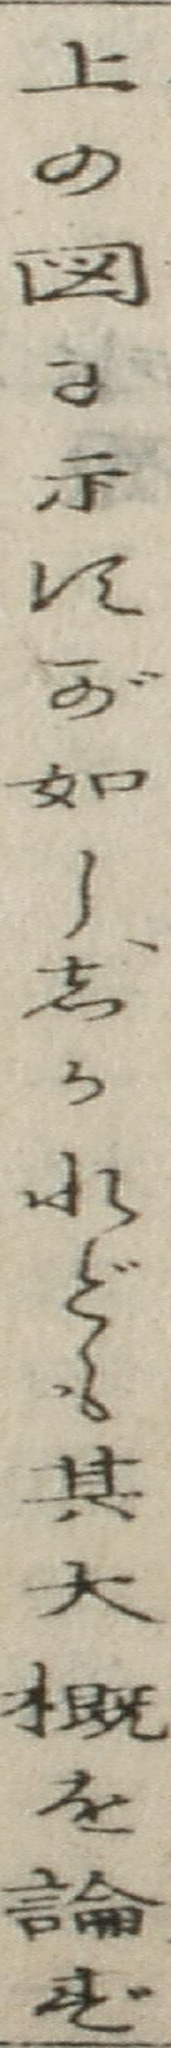上の図に示すが如し、しかれども其大概を論ず
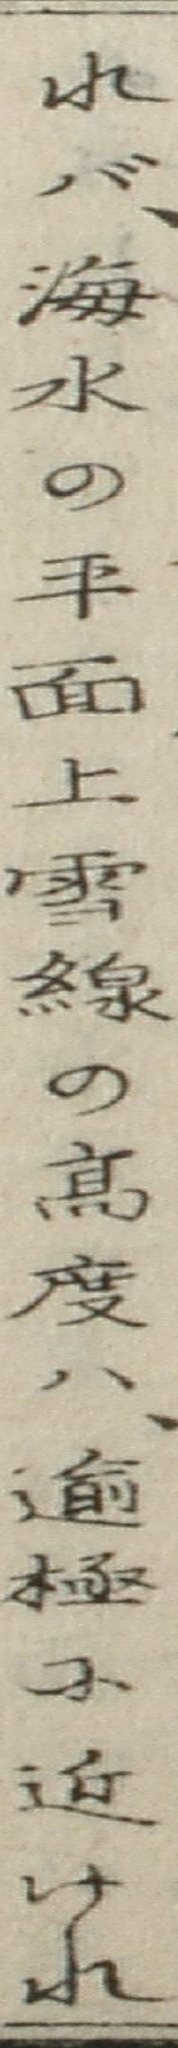れば、海水の平面上雪線の高度は、愈極に近けれ
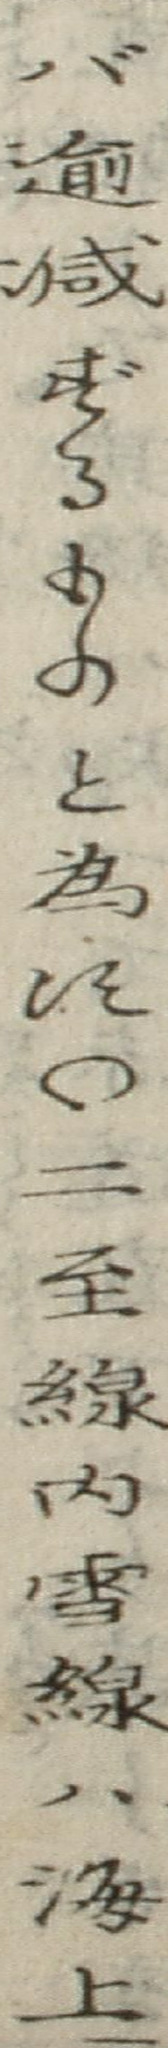ば愈減ずるものと為す、○二至線内雪線は、海中
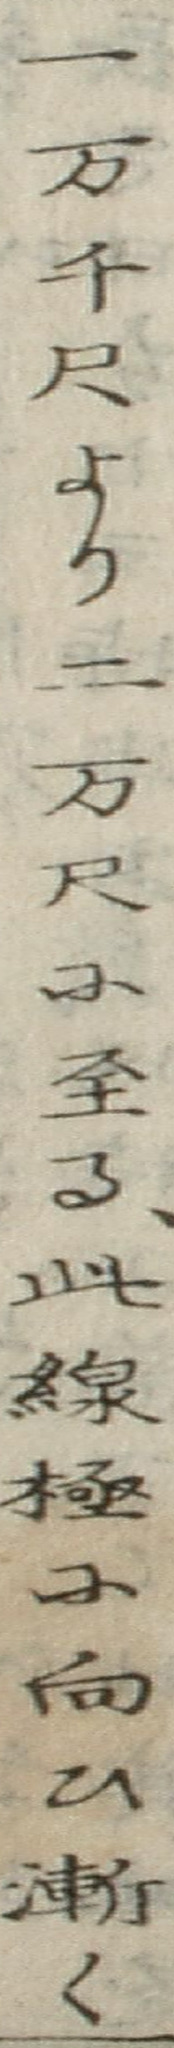一万千尺より二万尺に至る、此線極に向ひ漸く
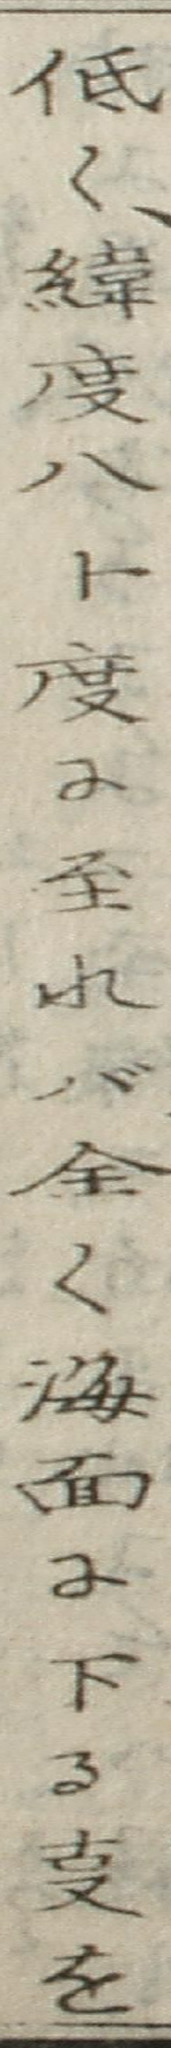低く、緯度八十度に至れば、全く海面に下る事を
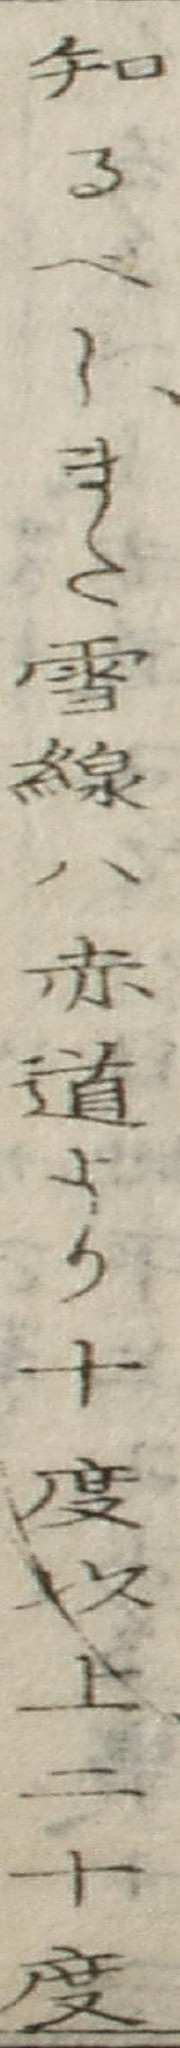知るべし、また雪線は赤道より十度以上、二十度
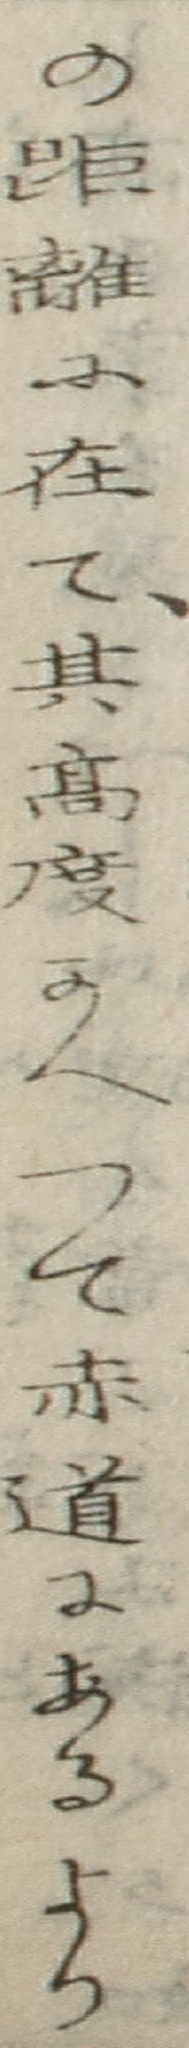の距離に在て、其高度かへつて赤道にあるより

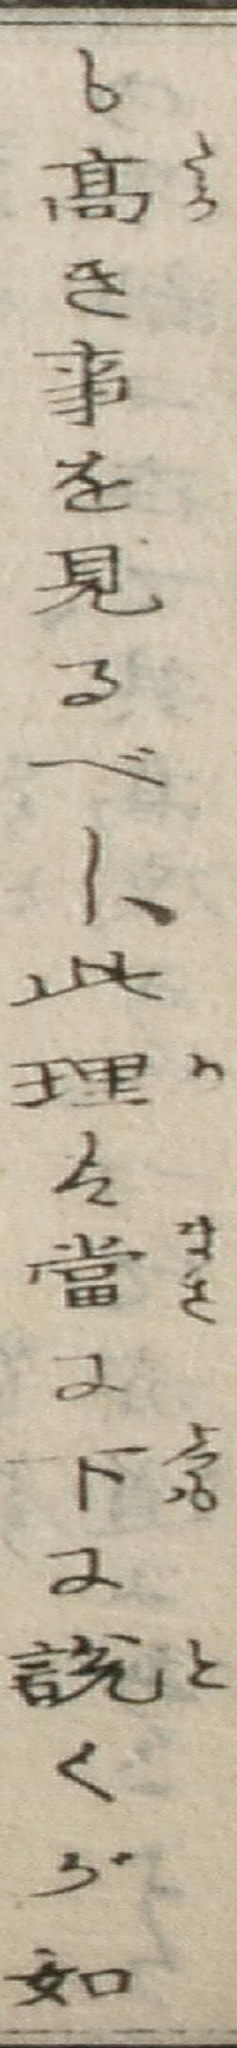も高き事を見るべし、此理は当に下に説くが如
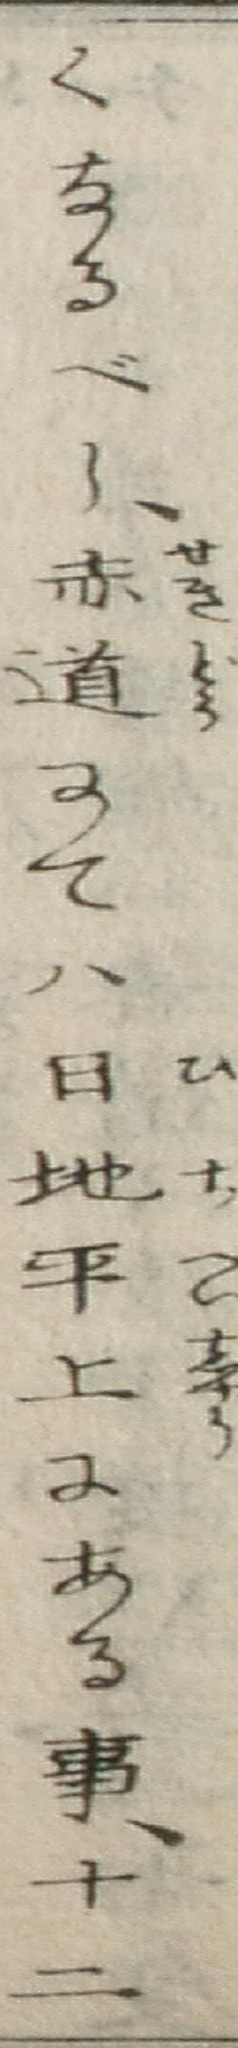くなるべし、赤道にては日地平上にある事、十二
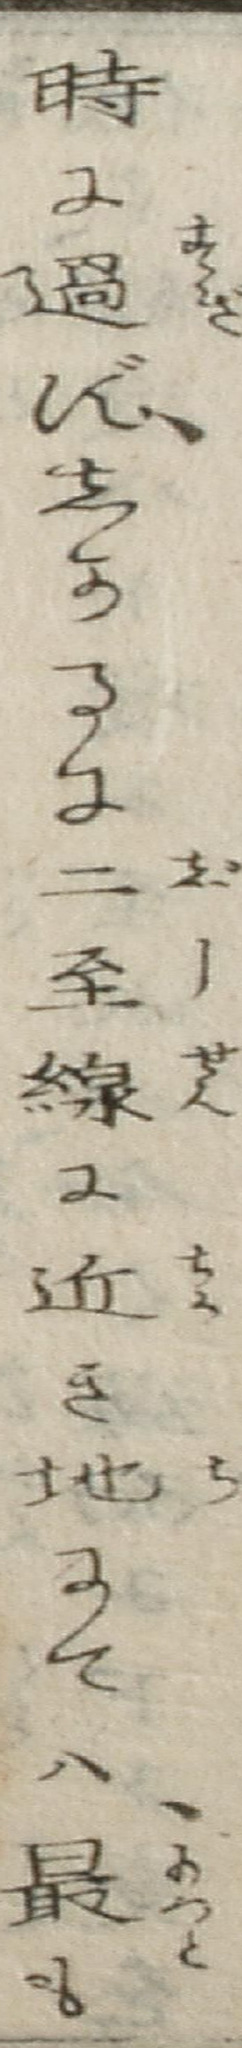時に過ず、しかるに二至線に近き地にては、最も
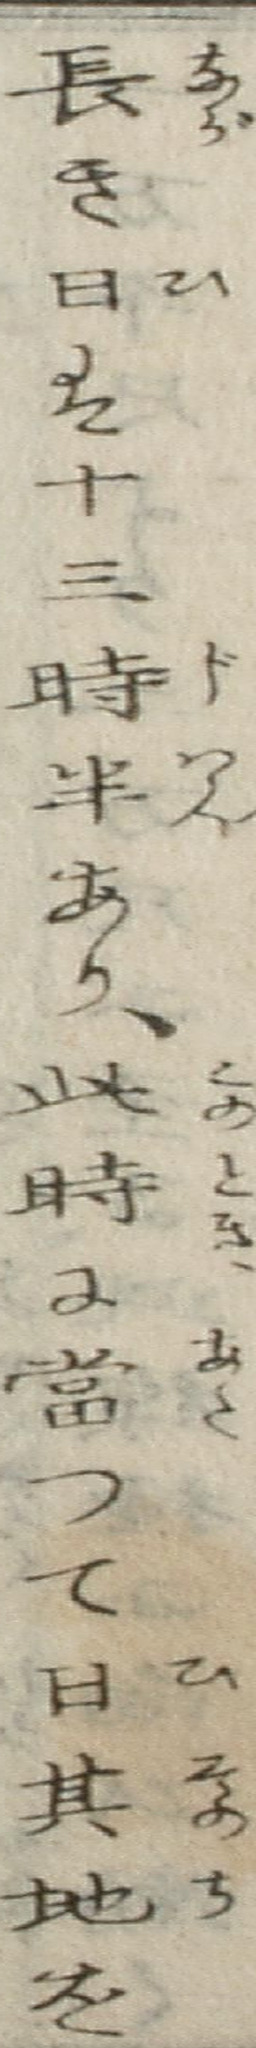長き日は十三時半あり、此時に当つて日其地を
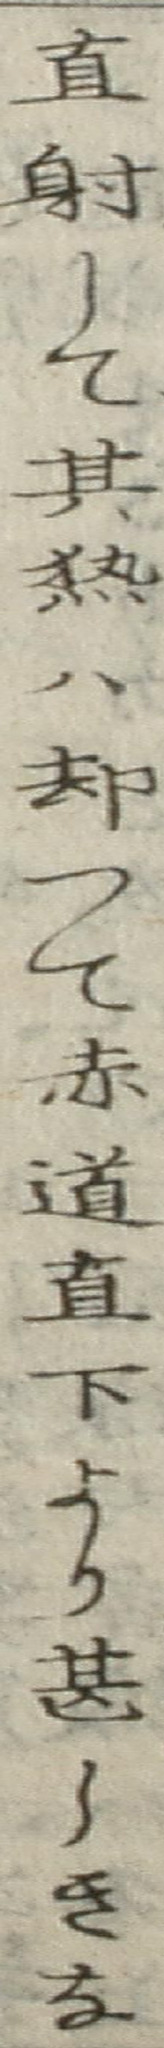直射して、其熱は却つて赤道直下より甚しきな
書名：訓蒙　天然地理學　下
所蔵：東京大学地震研究所図書室 Earthquake Research Institute Library, The University of Tokyo, JAPAN
